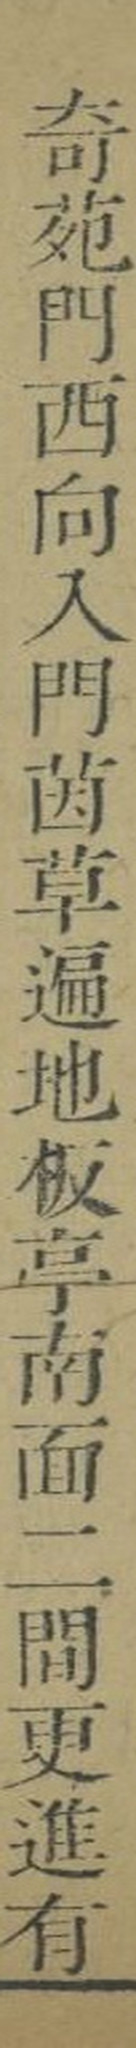奇苑門西向入門茵草遍地板亭南面二間更進有
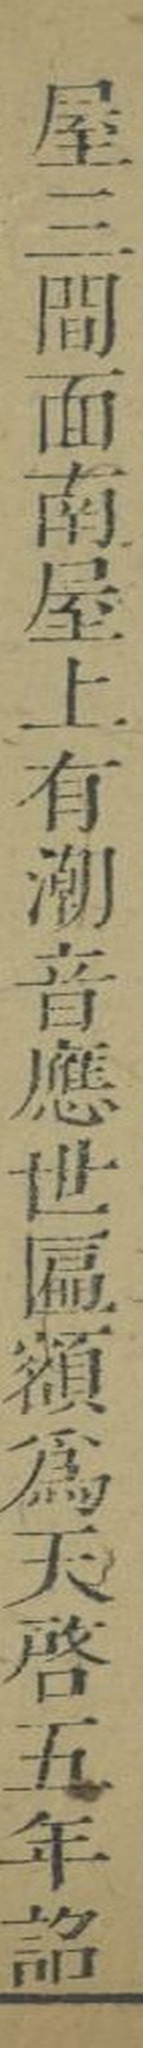屋三間面南屋上有潮音応世匾額為天啓五年詔
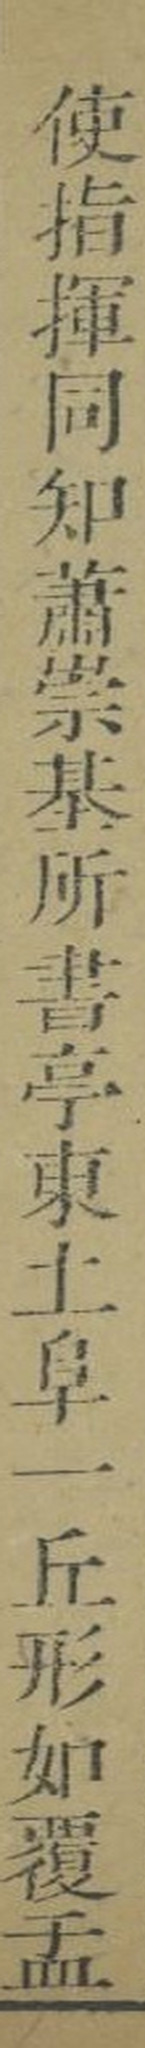使指揮同知蕭崇基所書亭東土阜一丘形如覆盂
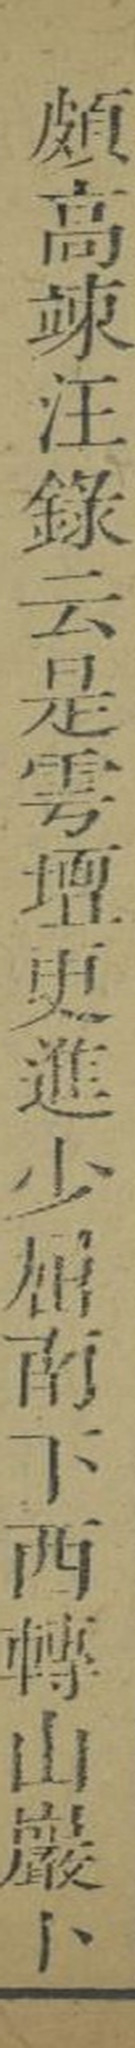頗高竦汪録云是雩壇更進少屈南下西転山巌
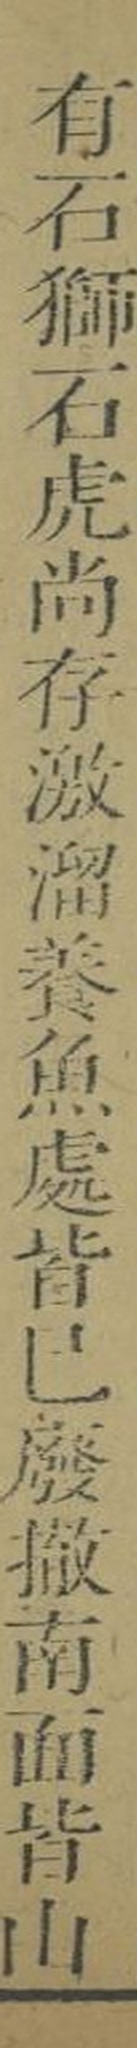有石獅石虎尚存激溜養魚処皆巳廃撤南面皆山
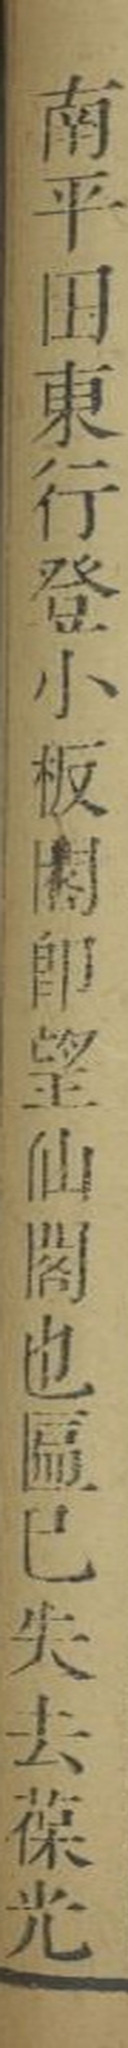南平田東行登小板閣即望仙閣也匾巳失去葆光
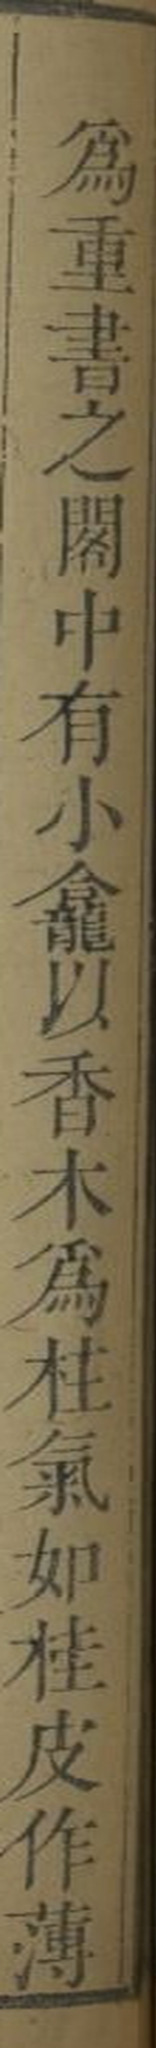為重書之閣中有小龕以香木為柱気如桂皮作簿
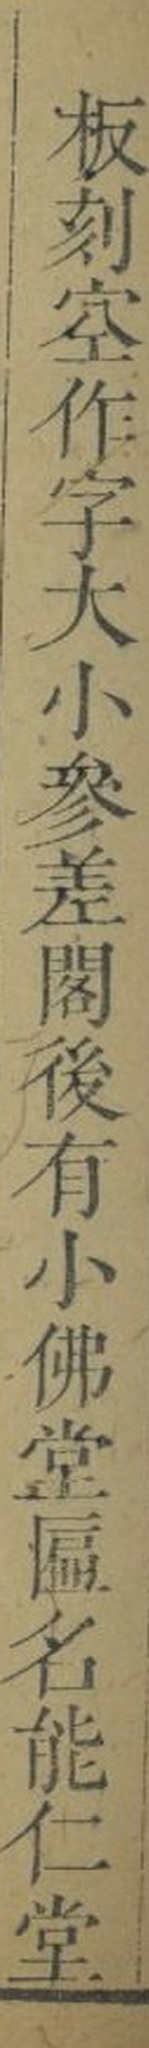板刻空作字大小参差閣後有小仏堂匾名能仁堂
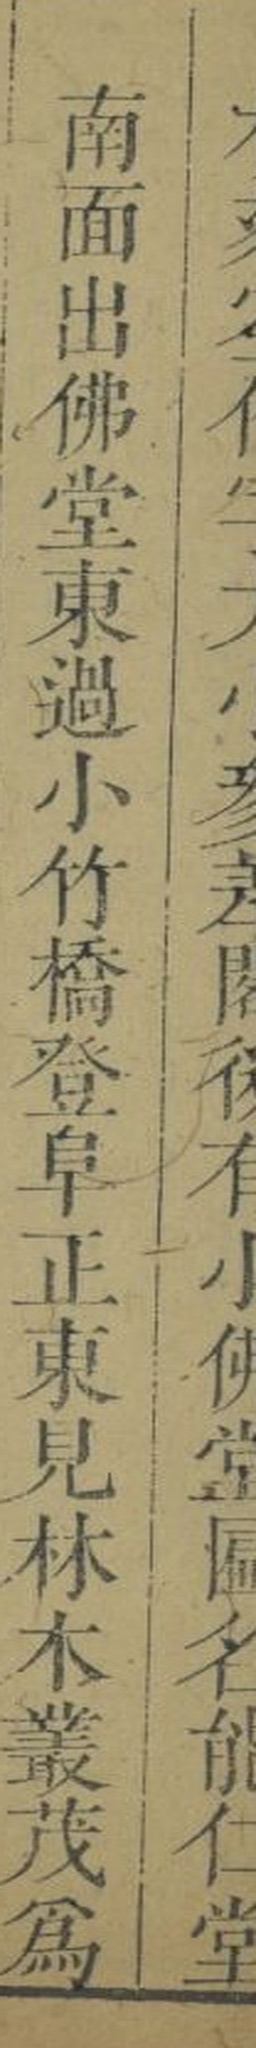南面出仏堂東過小竹橋登阜正東見林木叢茂為
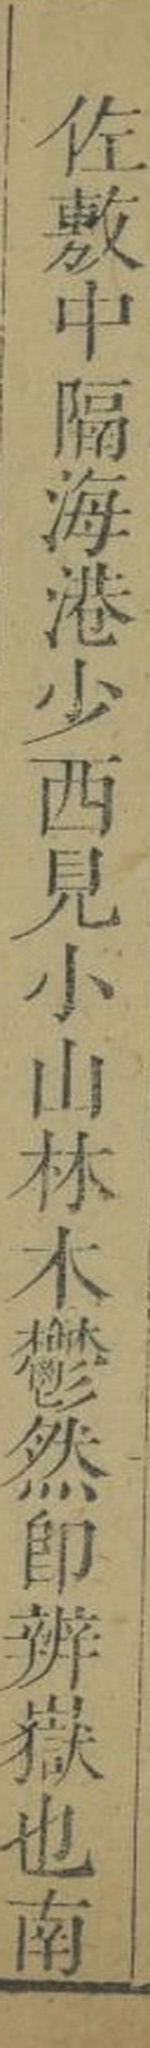佐敷中隔海港少西見小山林木鬱然即弁岳也南
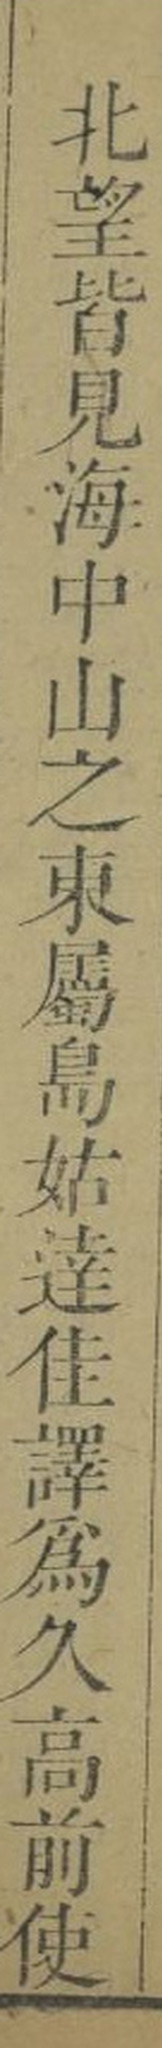北望皆見海中山之東属島姑達佳訳為久高前使
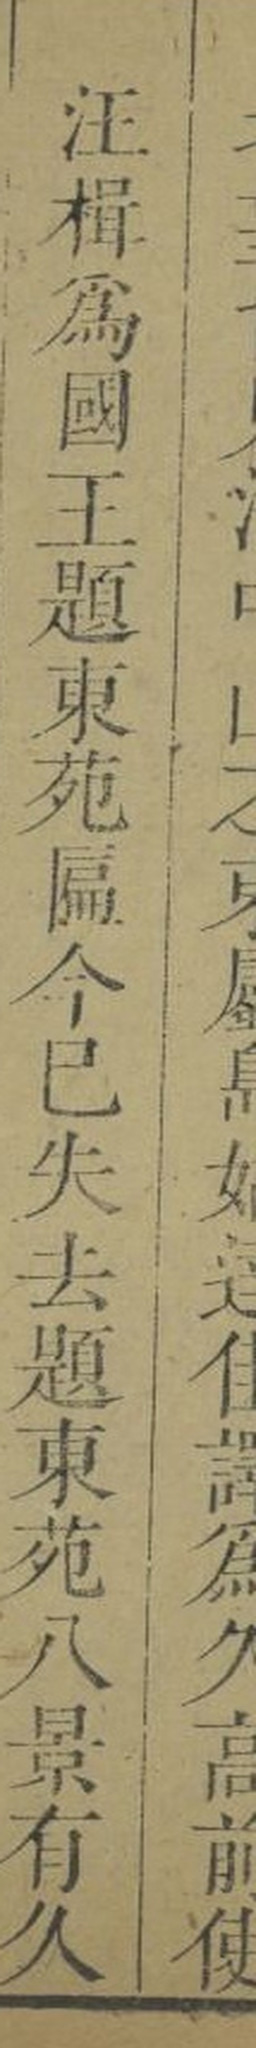汪楫為国王題東苑匾今巳失去題東苑八景有久
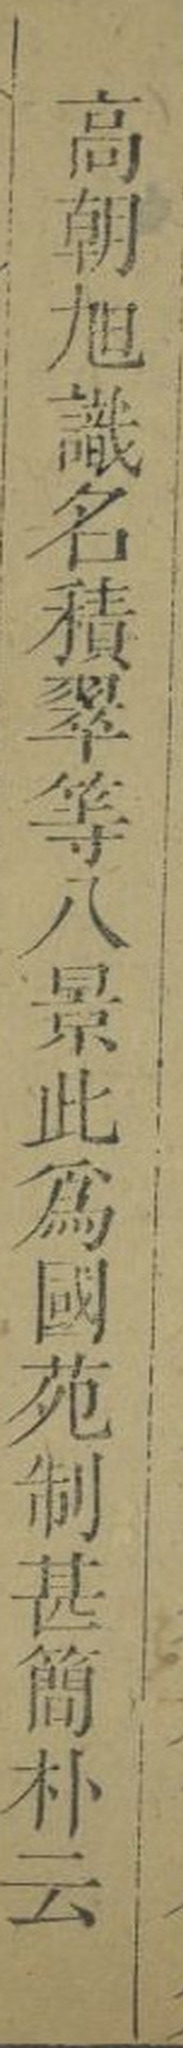高朝旭識名積翠等八景此為国苑制甚簡朴云
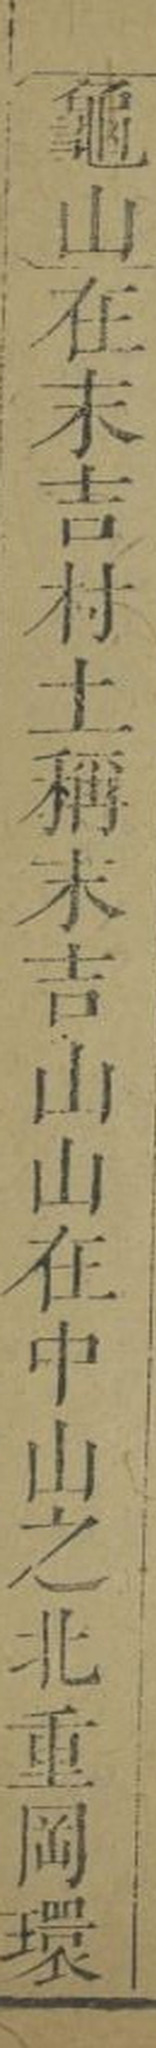[亀山]在末吉村土称末吉山山在中山之北重岡環
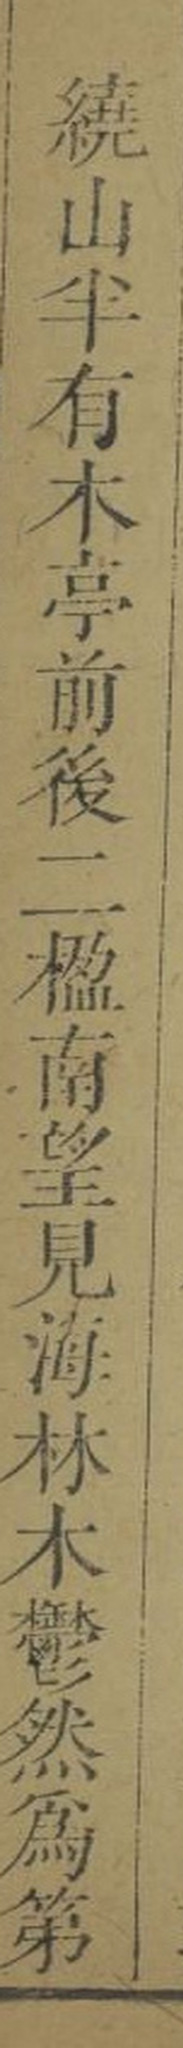繞山半有木亭前後二楹南望見海林木鬱然為第

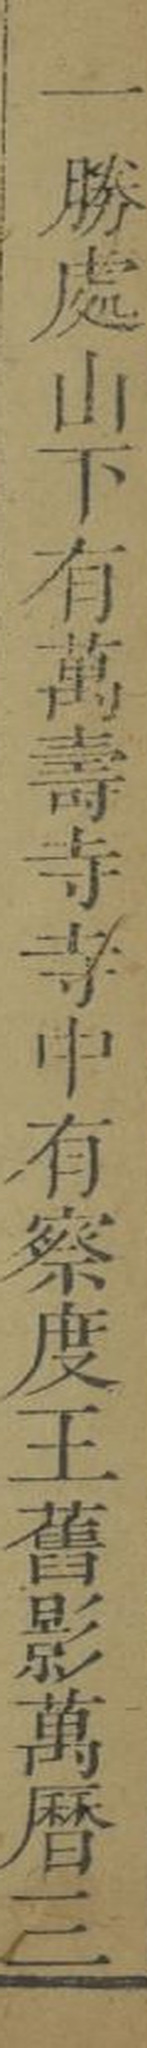一勝処山下有万寿寺寺中有察度王旧影万暦三
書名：中山伝信録 巻四
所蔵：University of the Ryukyus Library
